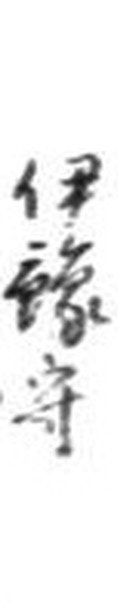伊予守
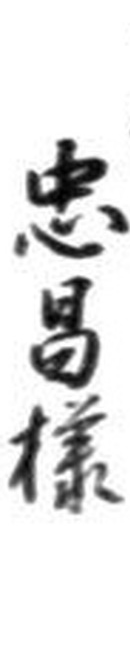忠昌様
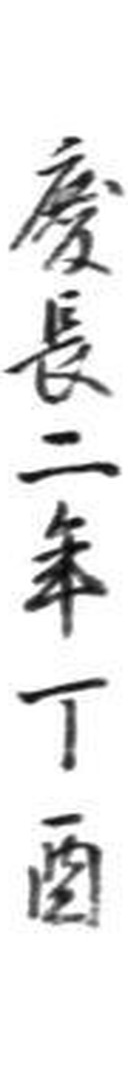慶長二年丁酉
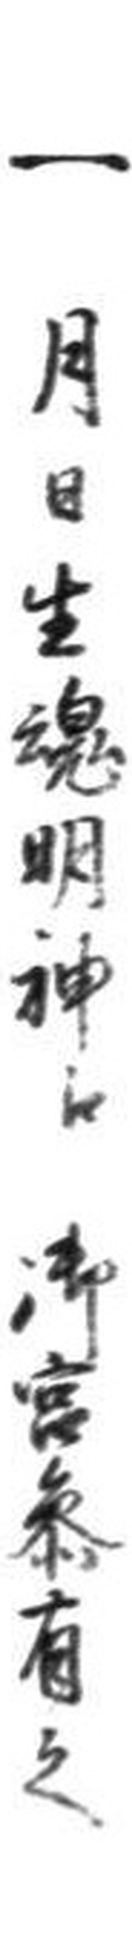一月日生魂明神江御宮参有之

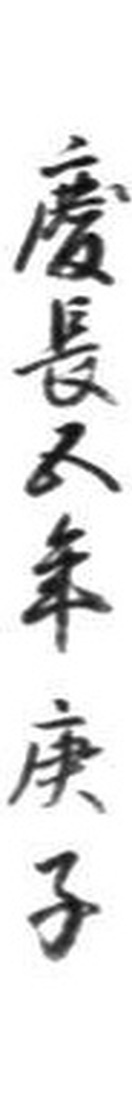慶長五年庚子
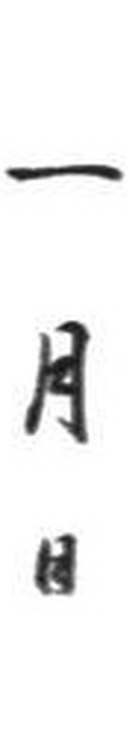一月日
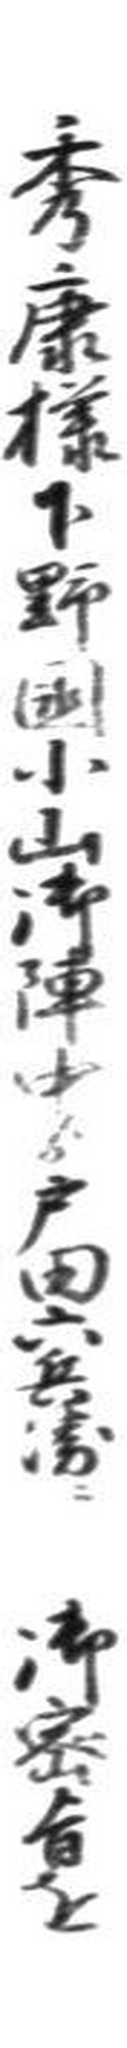秀康様下野国小山御陣中ゟ戸田六兵衛ニ御密旨を
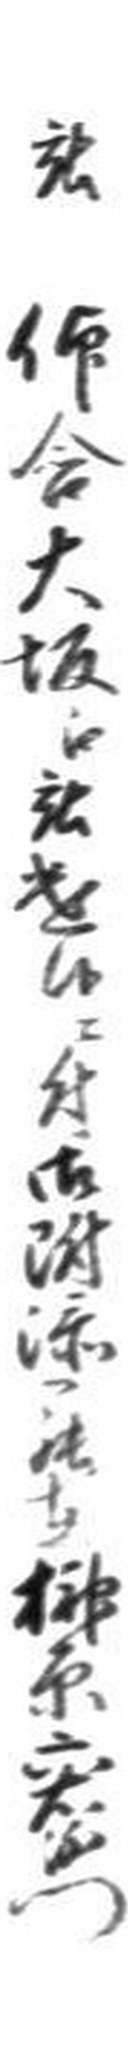被仰含大坂江被遣候ニ付御附添罷在榊原六右衛門
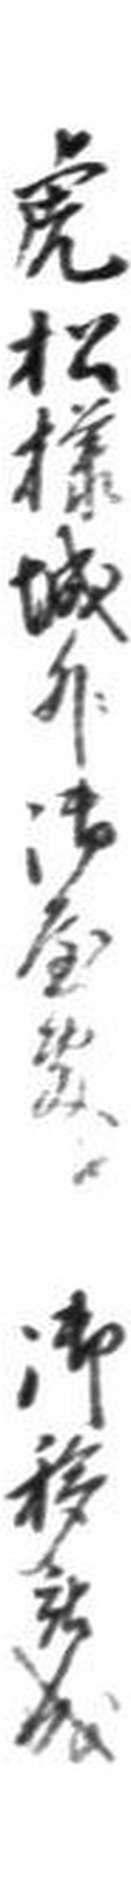虎松様城外御屋敷江御移被成

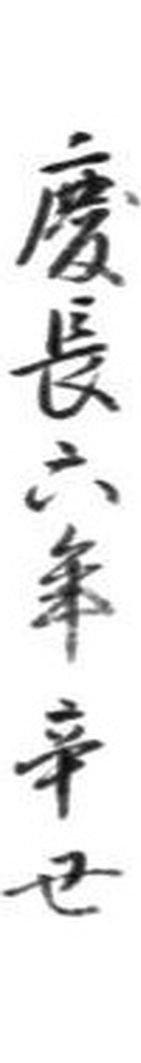慶長六年辛丑
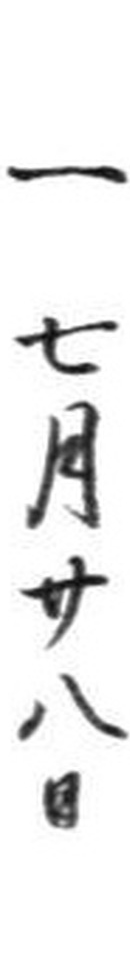一七月廿八日

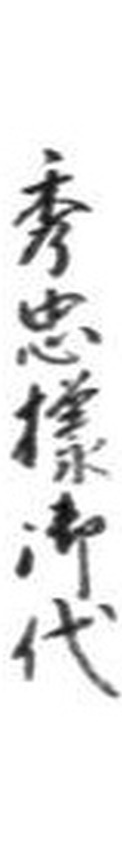秀忠様御代
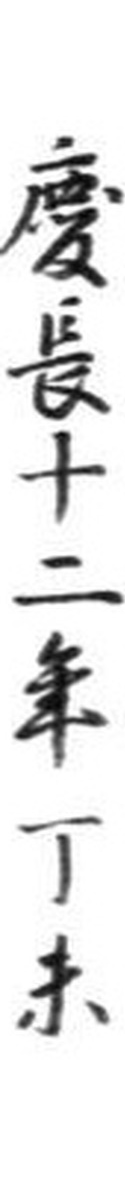慶長十二年丁未
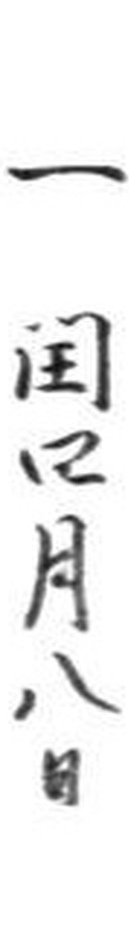一閏四月八日
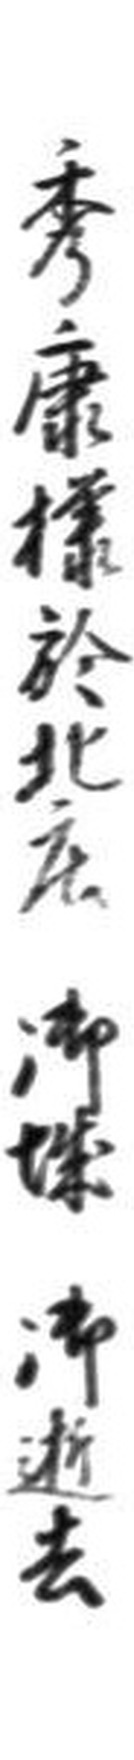秀康様於北庄御城御逝去

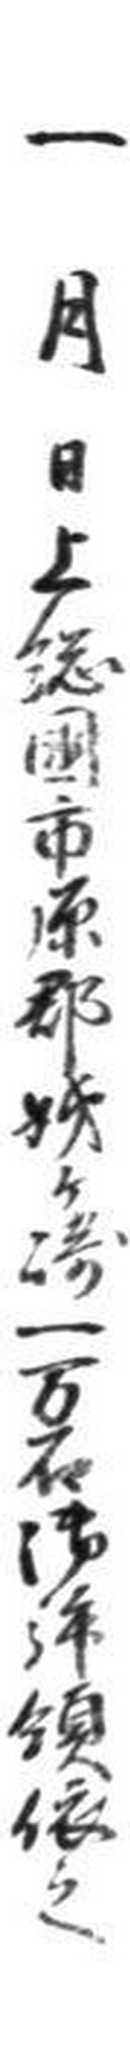一月日上総国市原郡姉ヶ崎一万石御拝領依之
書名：家譜 三 忠昌公 従慶長八年到寛永六年
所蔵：福井県文書館 Fukui Prefectural Archives
